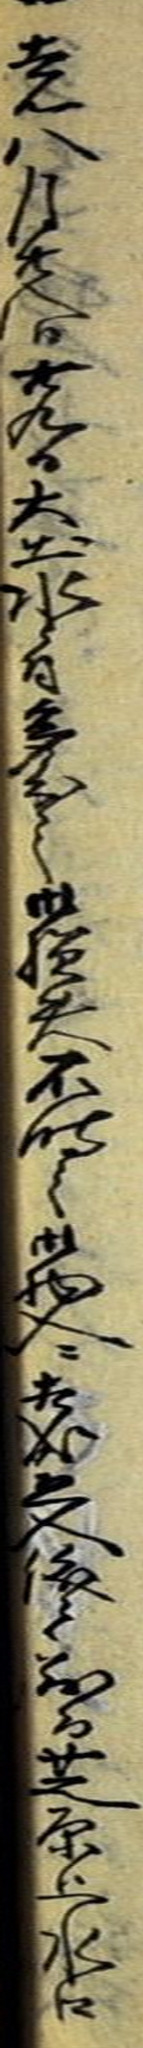〇去ル八月廿八日廿九日大出水ニ付多分之御損失不時之御物入ニ相成恐入儀ニ候別而芝原上水口
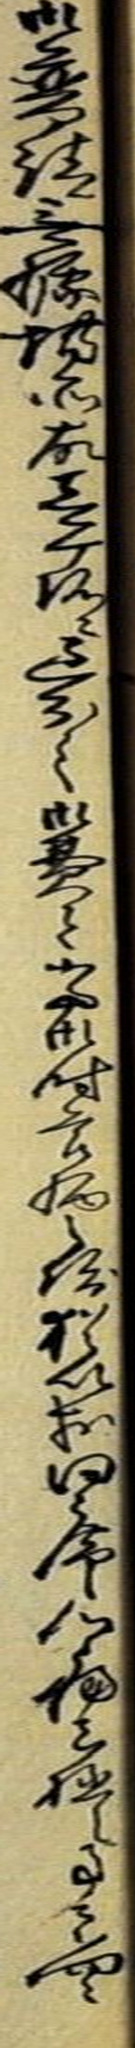御普請無拠場所故壱ケ所ニ過分之御費ニて当御時節柄之儀猶以於同席心痛至極之事ニ候向々
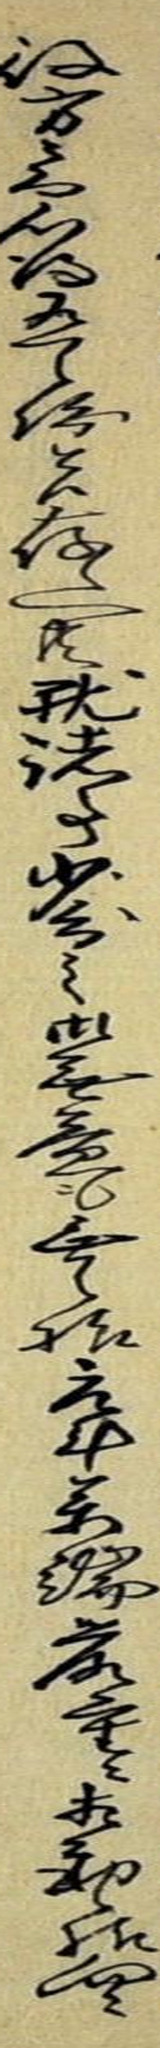役方ニ而心得有之儀とハ存候へ共就諸事少分之御無益も無之様取計万端厳重ニ相勤候様向々
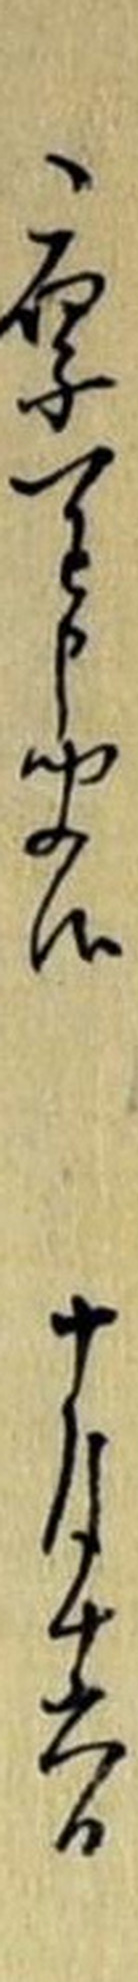へ厚可被申聞候十月十六日
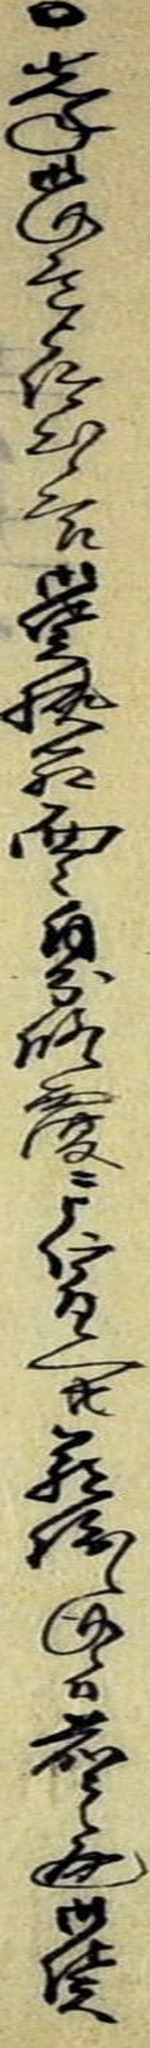〇先年御趣意被仰出候節御貸挟箱面々自分修覆ニ被仰付候へ共難儀之趣ニ付前々之通御貸
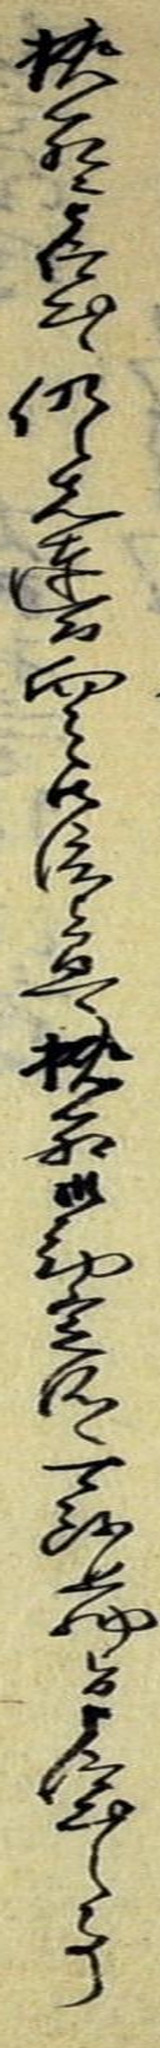挟箱ニ被仰出候仍之先達而向々へ御渡被置候挟箱御勘定所へ可致上納旨被仰出候事
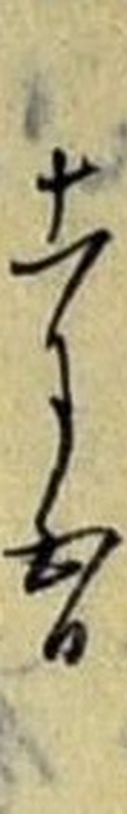十一月五日
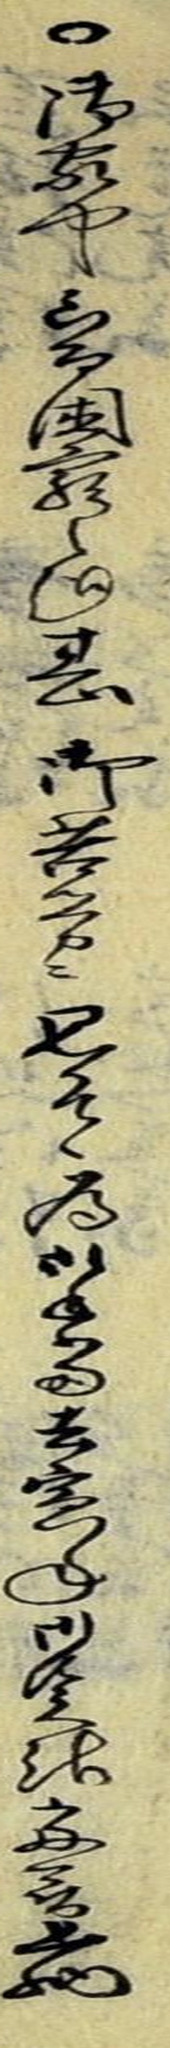〇御家中至而困窮之趣甚御苦労ニ思召候為御手当去寅年御貸銀当暮上納
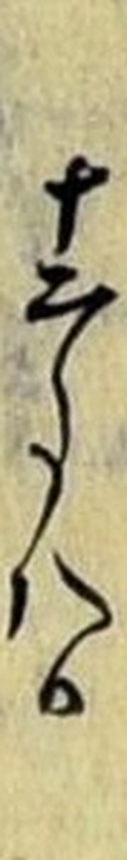十一月五日
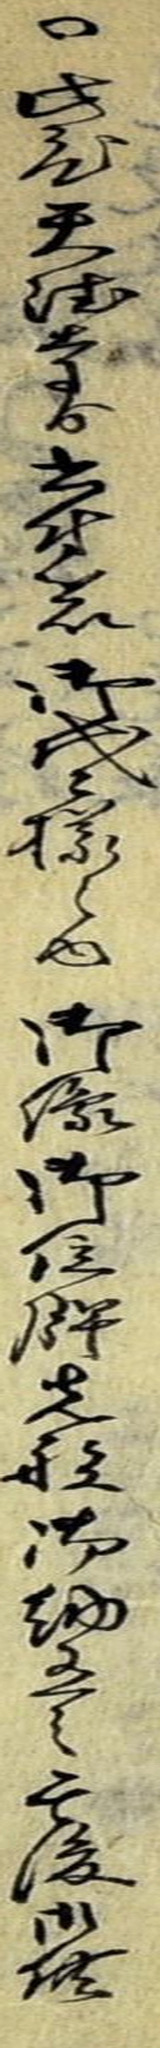〇此度天徳寺ゟ書付を以御代々様之内御像御位牌先般御納有之其後御供
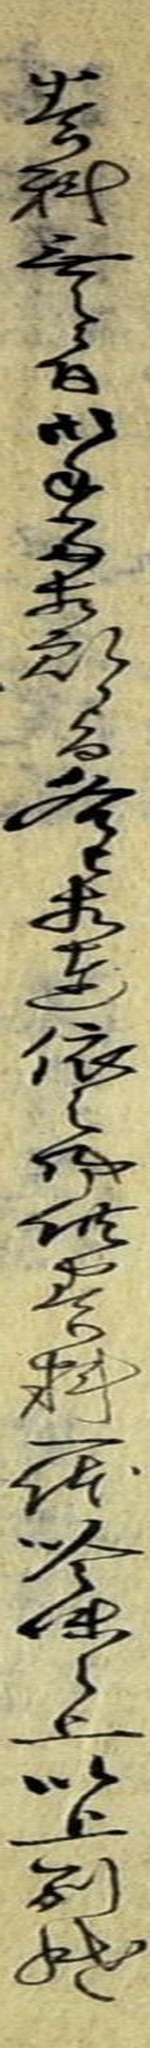養料無之ニ付御手当相願候旨各被相達依之御供養料一体吟味之上以上別紙之
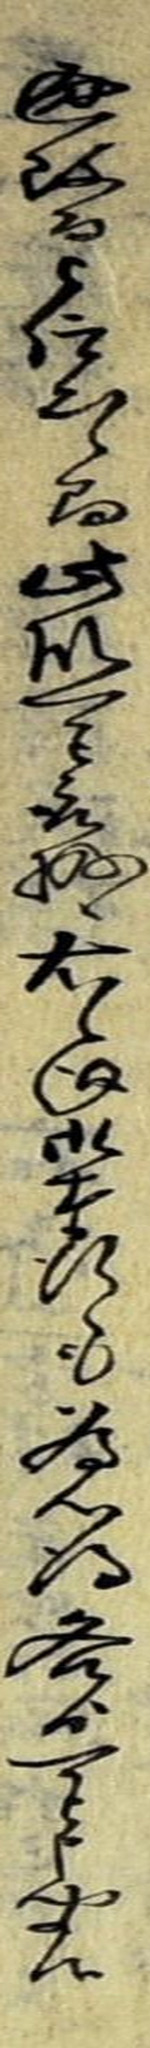通改而被仰出候間此段可被取扱候右之趣御奉行へも為心得各ゟ可被申聞候

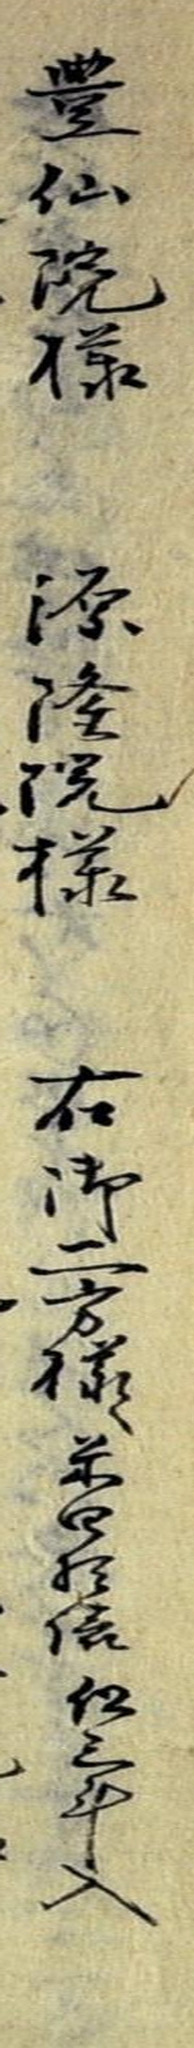豊仙院様源隆院様右御ニ方様へ米四拾俵但三斗入
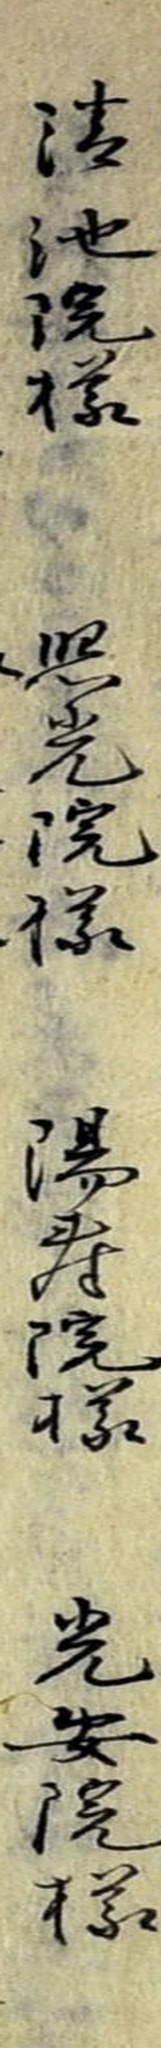清池院様照光院様陽寿院様光安院様
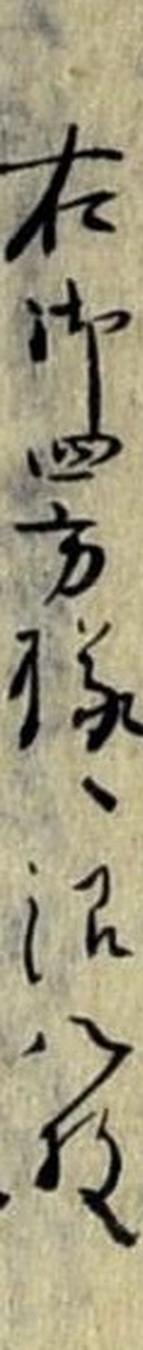右御四方様へ銀八枚
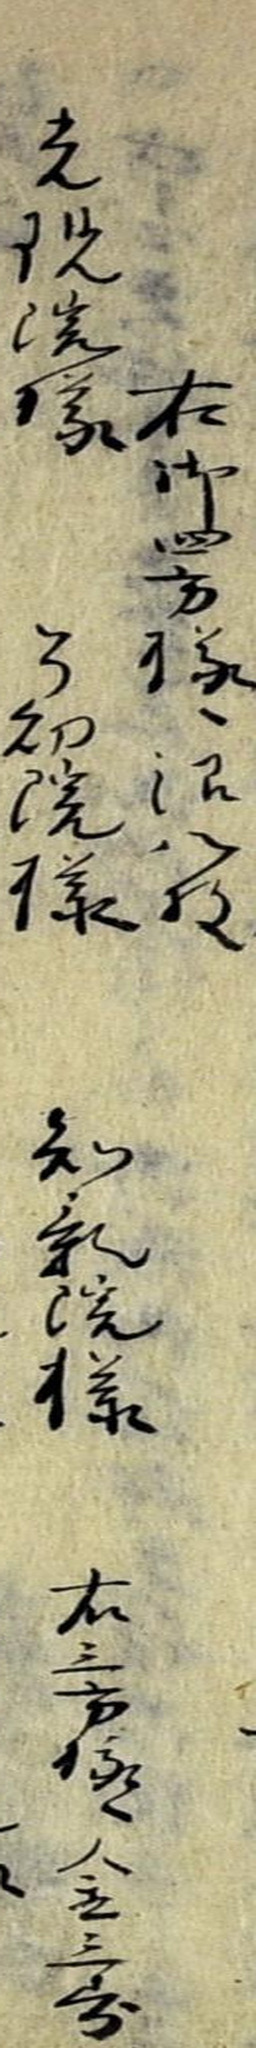光現院様了院様知新院様右三方様へ金三歩
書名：命令之部 三
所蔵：福井県文書館 Fukui Prefectural Archives
